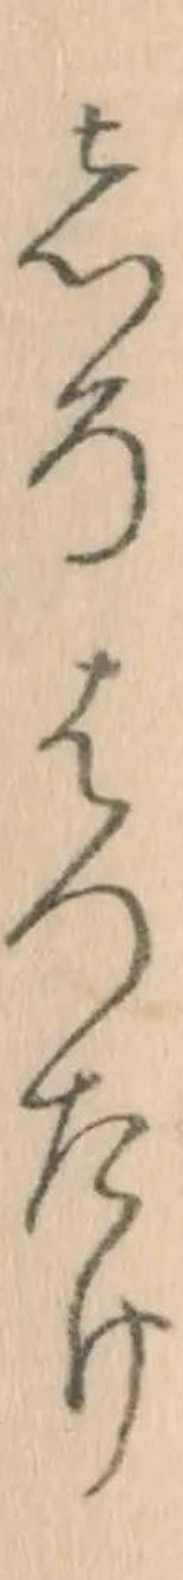しろはつたけ
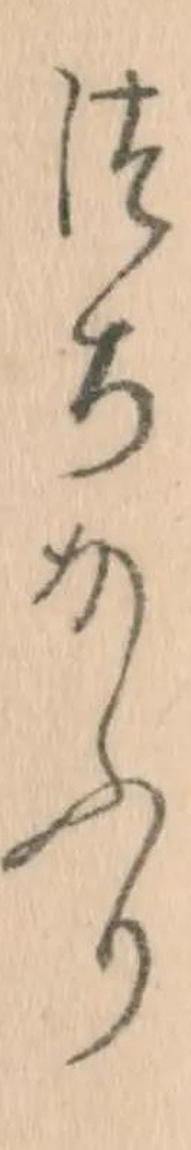つちかふり
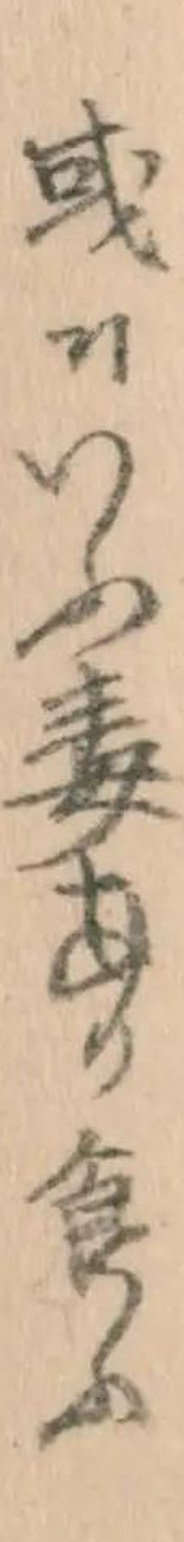或はいふ毒あり食ふ
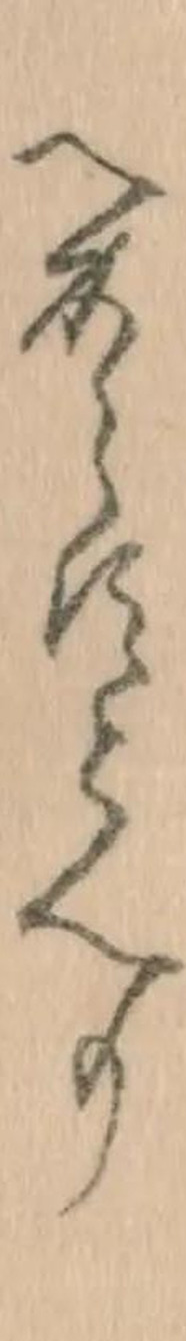へからすとへり
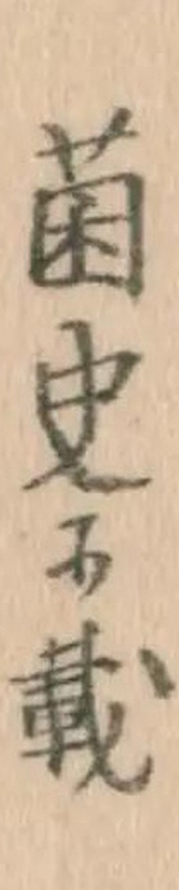菌史に載
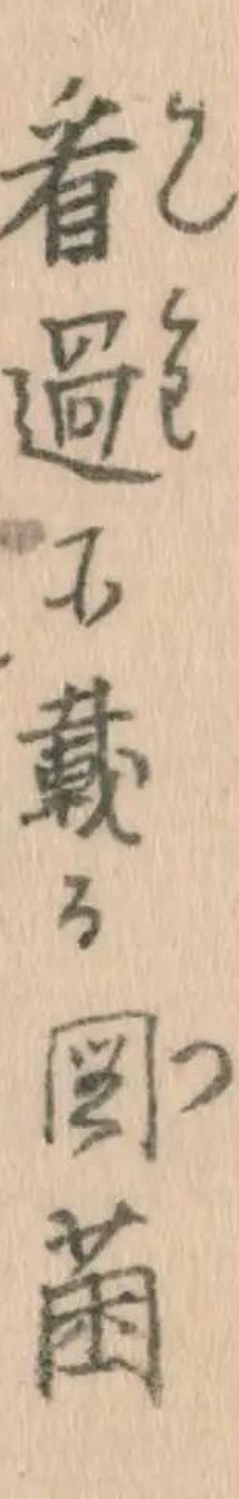看過に載る図菌
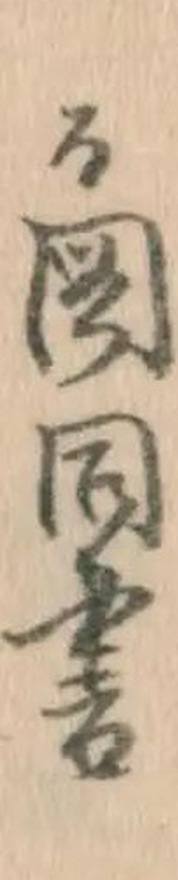る図同書
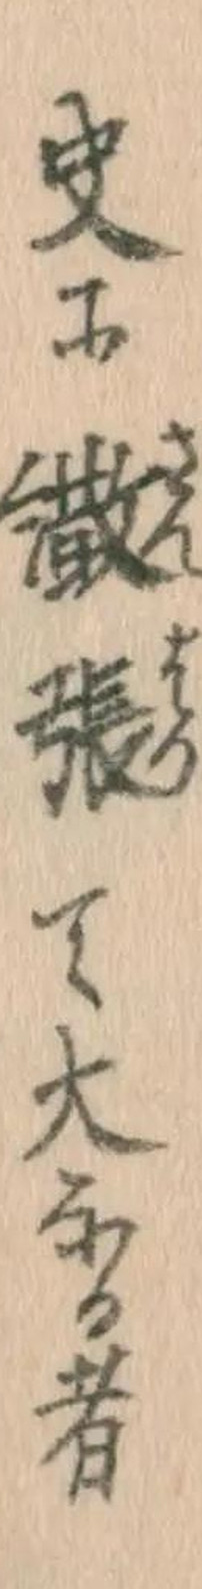史に繖張て大なる者
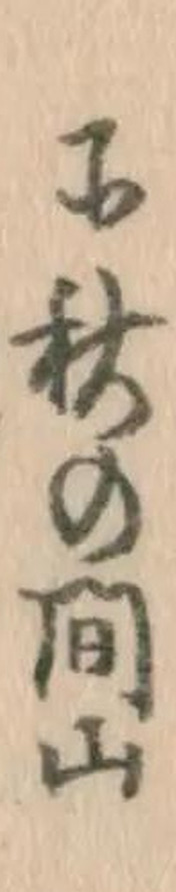に秋の間山
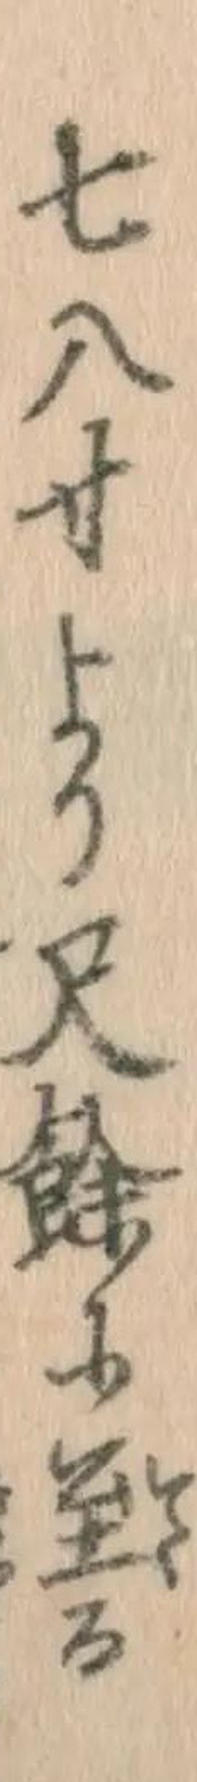七八寸より尺余に至る
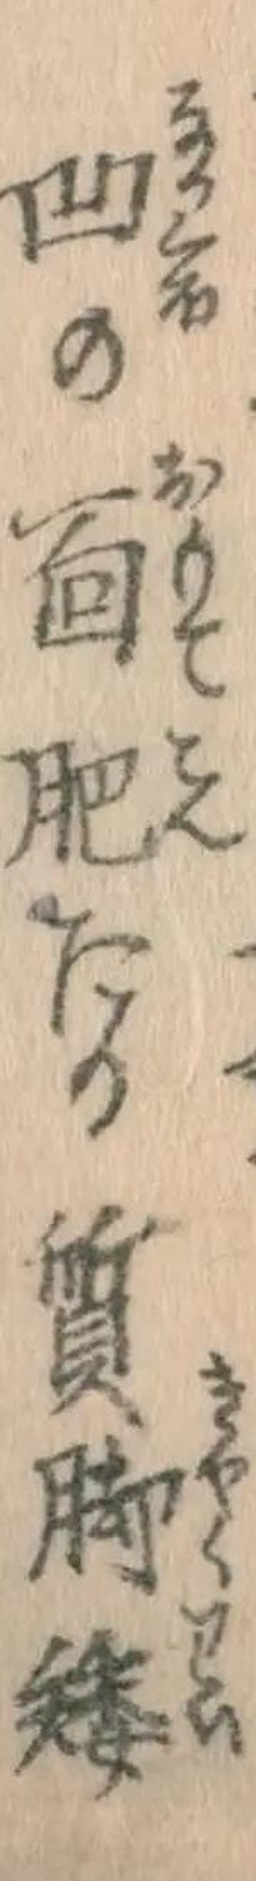凹の面肥たる質脚矮
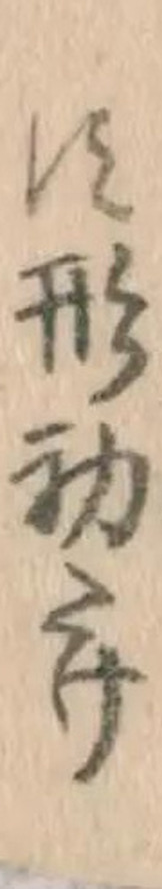す形たけ
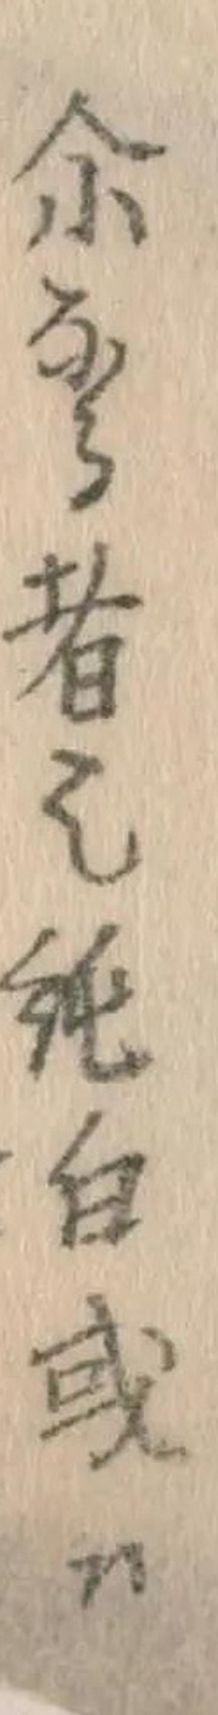爾なる者也純白或は
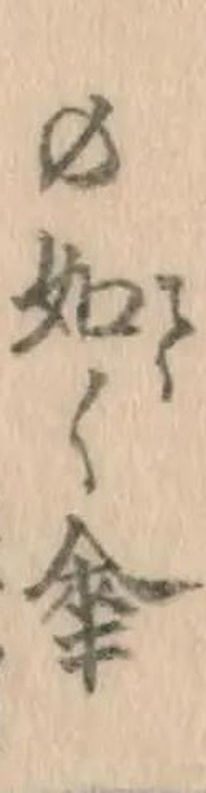の如く傘
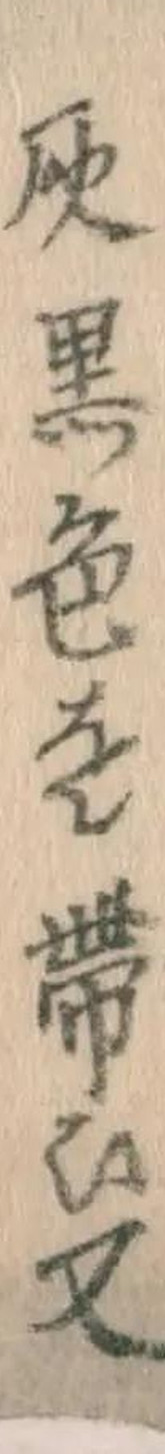灰黒色を帯ひ又
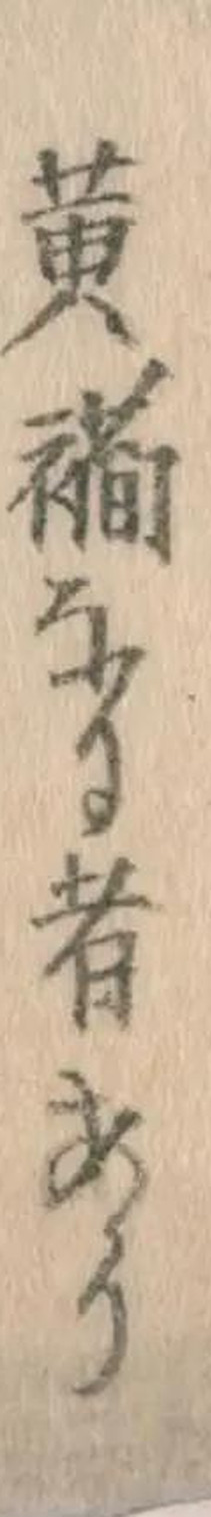黄なる者あり
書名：本草図譜. 巻55-57
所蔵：国立国会図書館 National Diet Library, JAPAN
